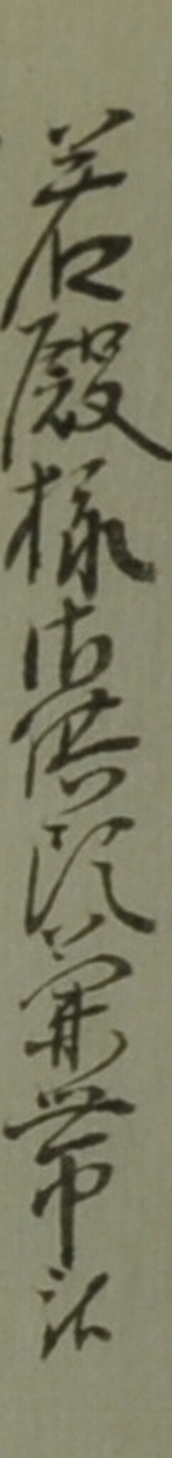若殿様御供頭兼帯被
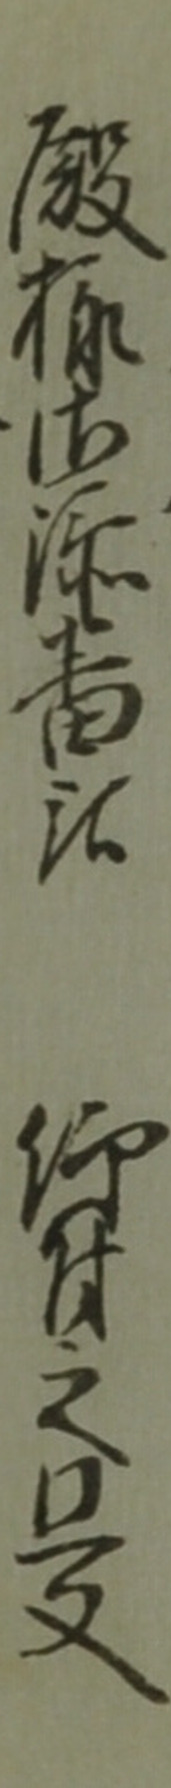殿様御添番被仰付之且又

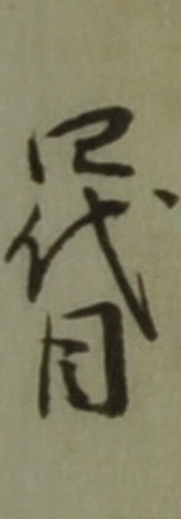四代目
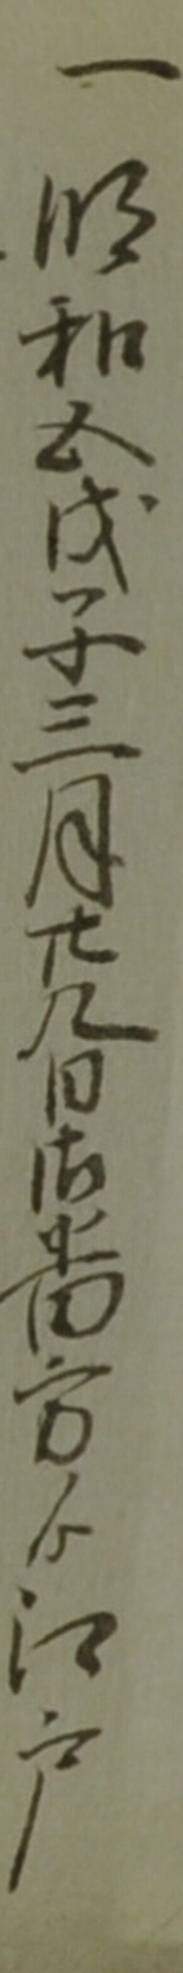一明和五戌子三月廿九日御番方より江戸
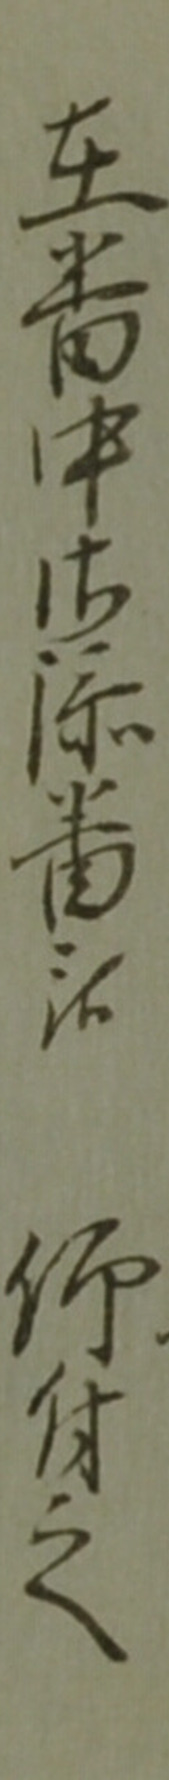在番中御添番被仰付之
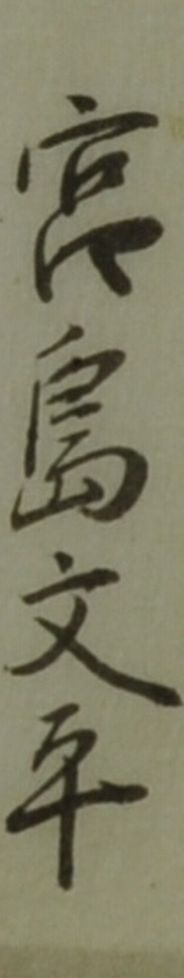宮島文平
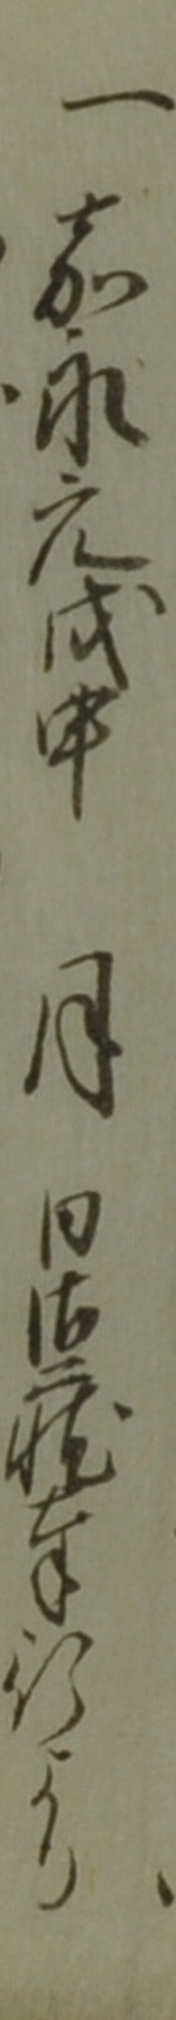一嘉永元戌申月日御蔵奉行より
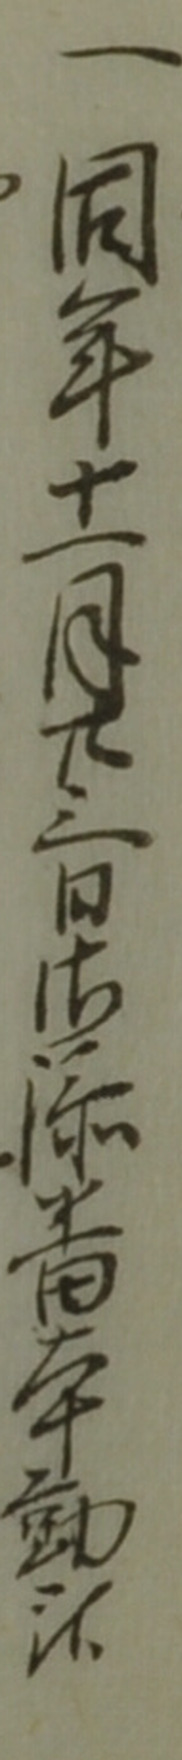一同年十一月廿三日御添番本勤被
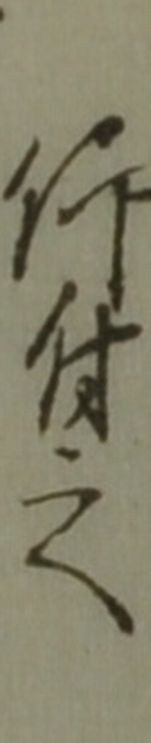仰付之
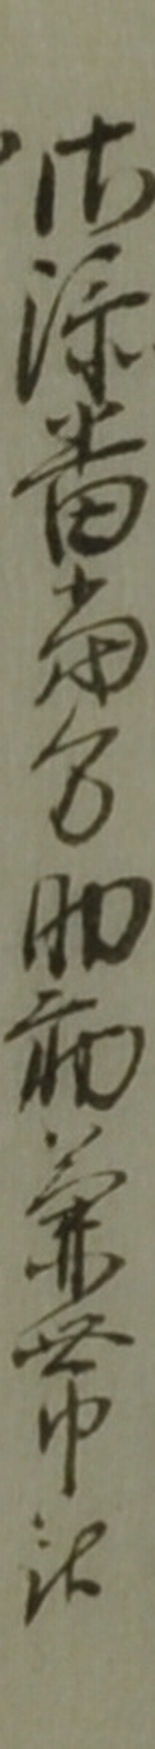御添番当方助勤兼帯被
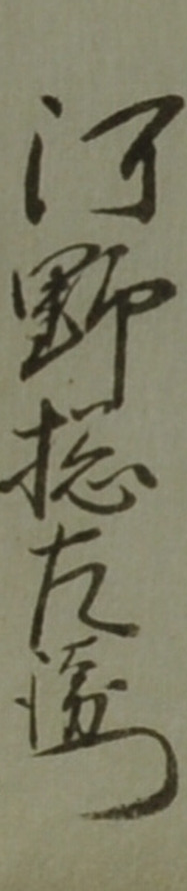河野捴左衛門
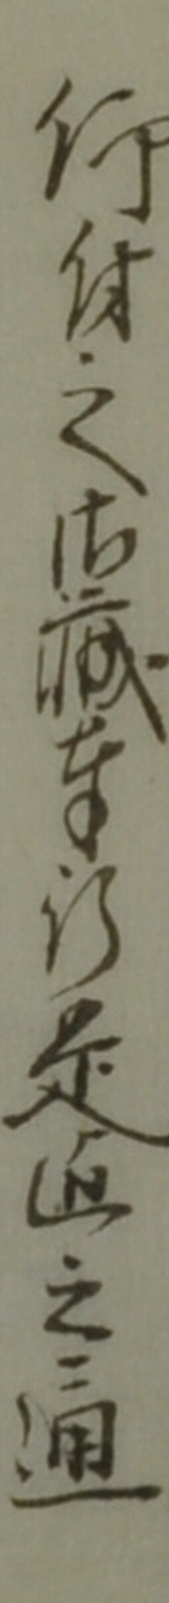仰付之御蔵奉行是迄之通

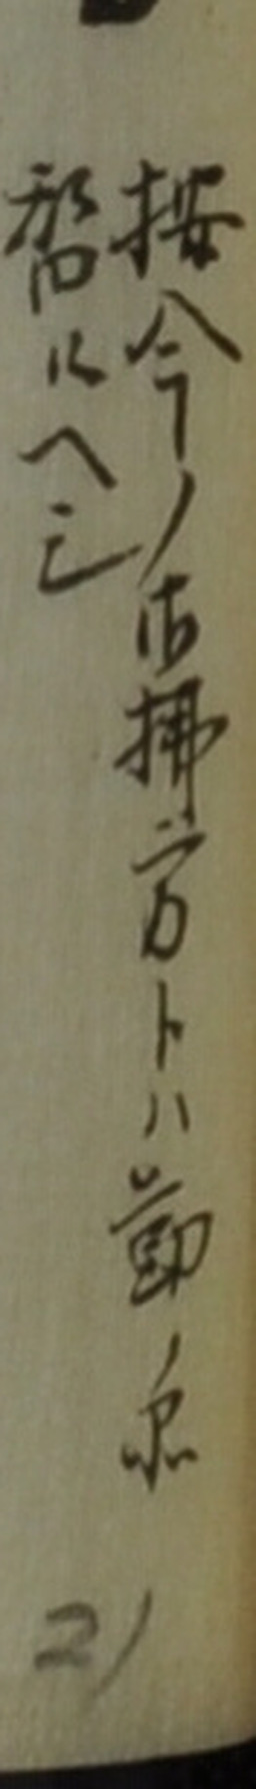替ルヘシ
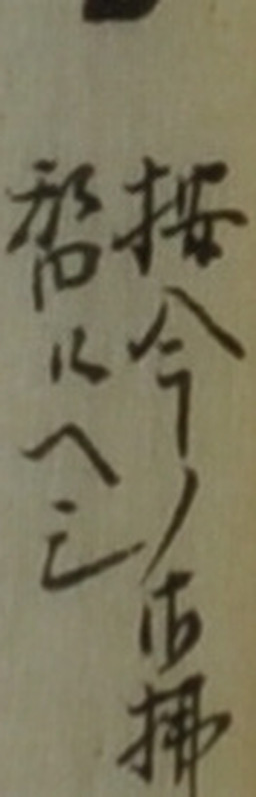替ルヘシ
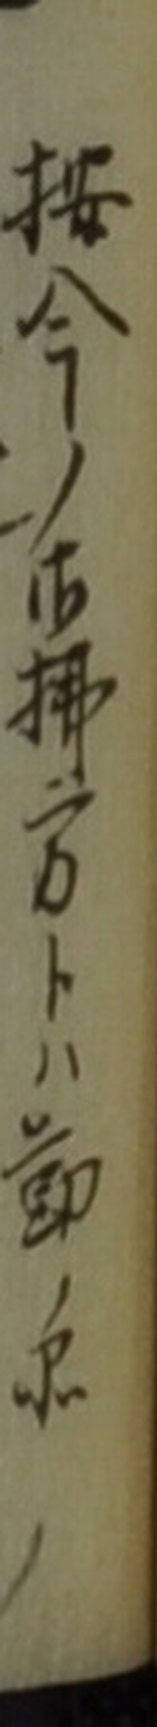御払方按今の御払方トハ勤ノ品
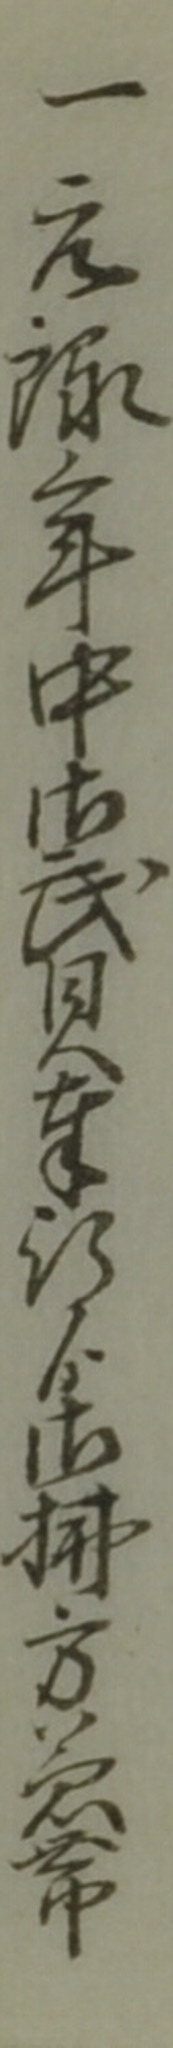一元禄年中御武具奉行より御払方兼帯
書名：諸御役代々録（八）
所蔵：伊那市立高遠町図書館・合同会社AMANE
